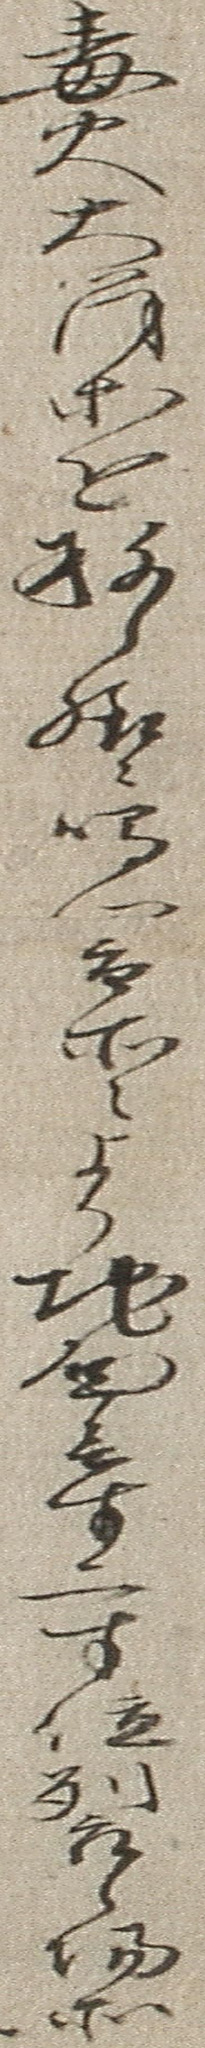毒火大筒等を放候様に鳴響所々より地面壱寸二寸位裂候場所共
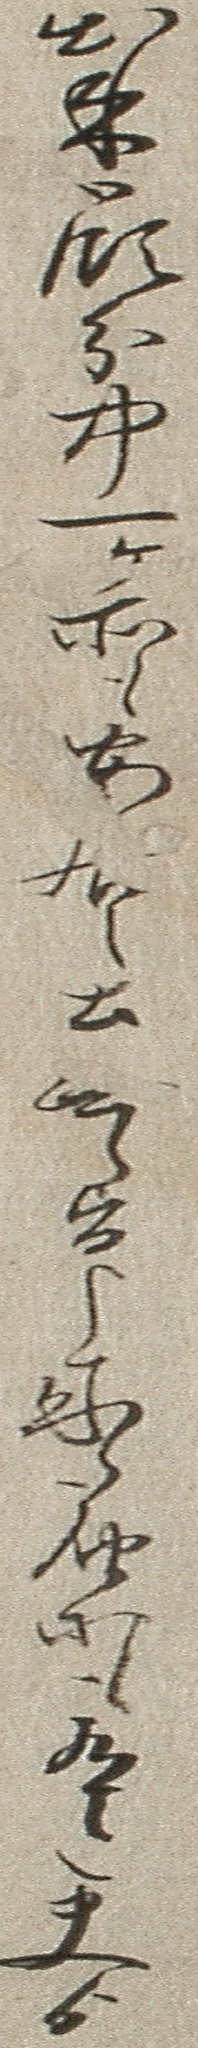出来御領分中一ヶ所も安居候土無之旨申来御届にも有之候夫ゟ
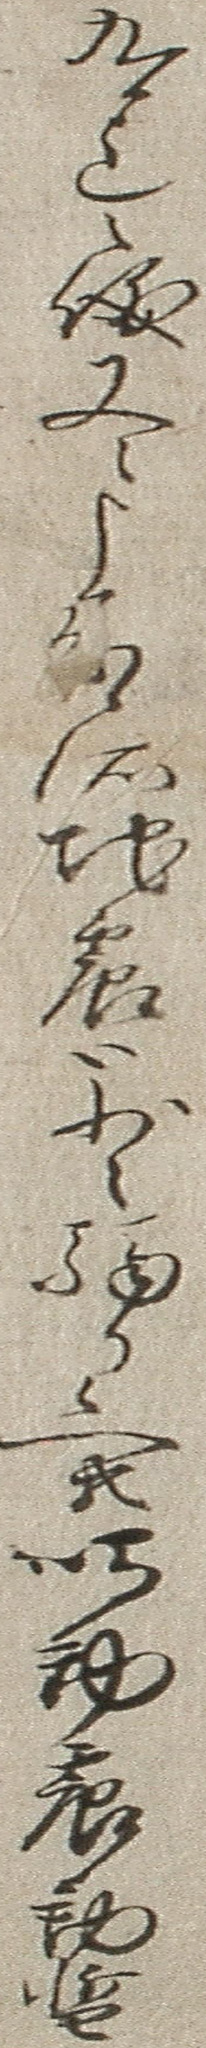九日迄之儀又々申来候所地震は少し弱り候へ共鳴動震動暫も
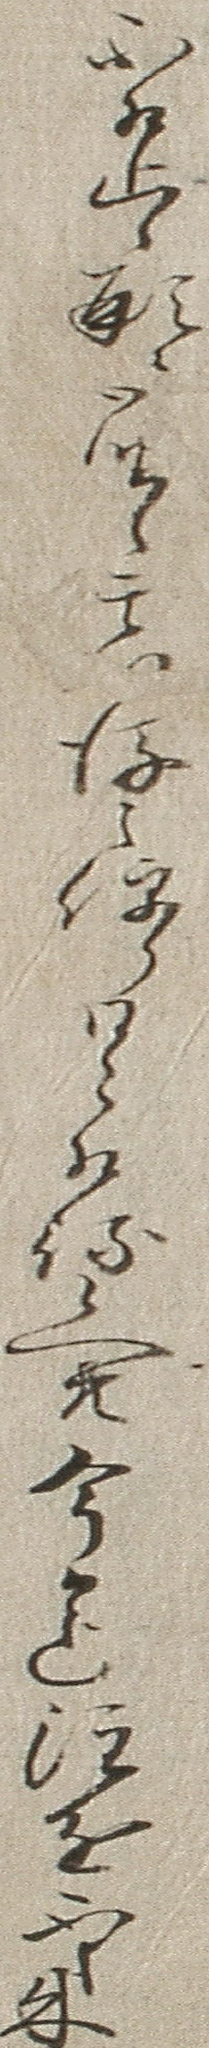不相止候形に御座候其以後之便り日々相待候へ共今日迄注進不申来
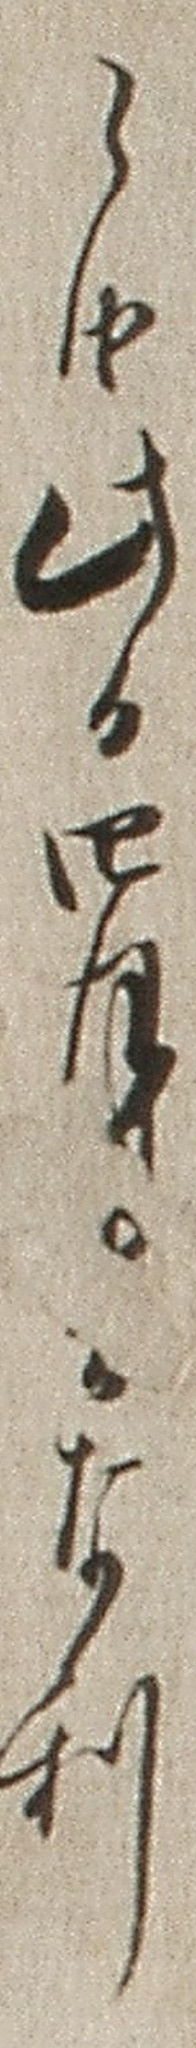候由此日四月◯日なり
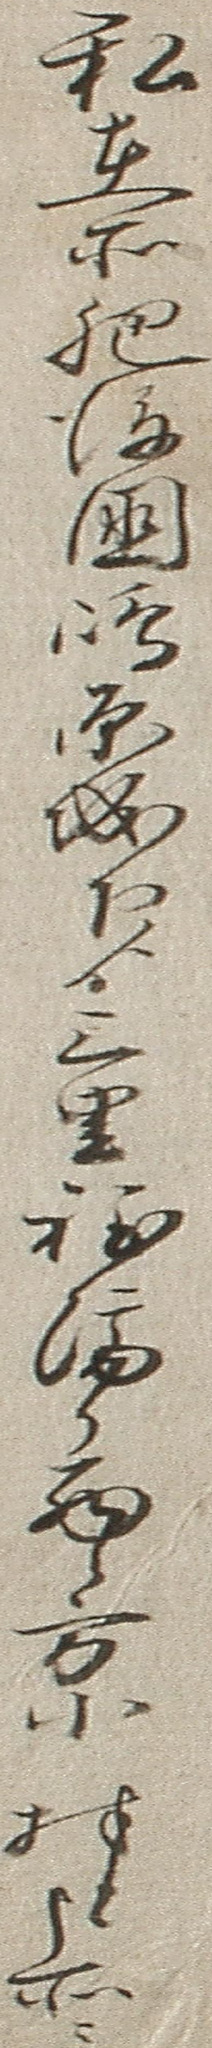私在所肥後国島原城下ゟ三里程隔り西之方小村と申所に
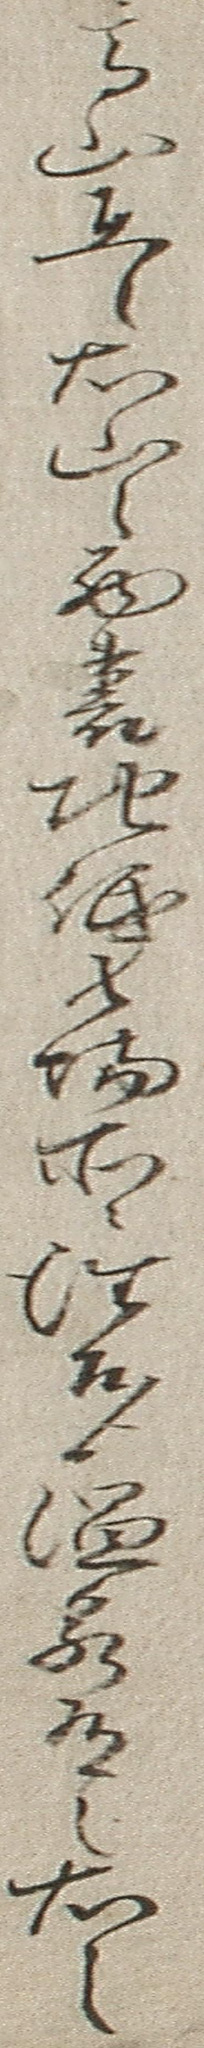高山在之右山之西裏地低き場所に往古ゟ温泉有之右之

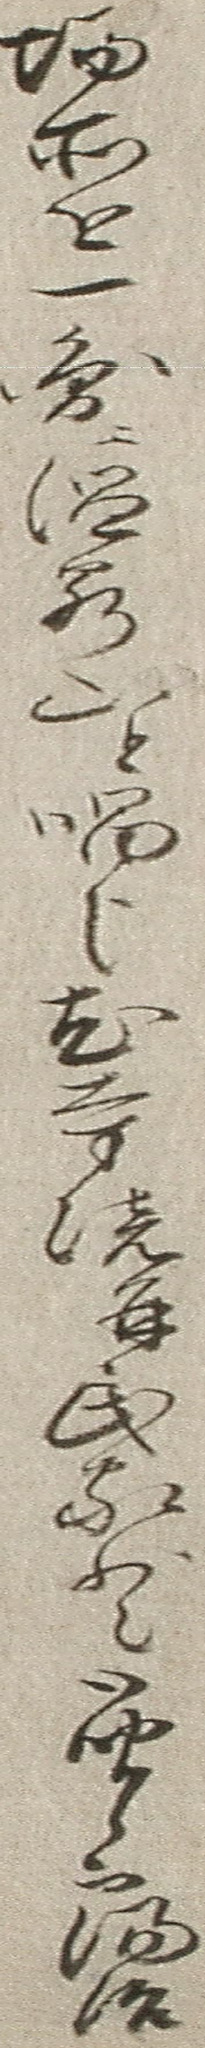場所を一円ニ温泉山と唱申候尤寺院并民家少し御座候而湯治
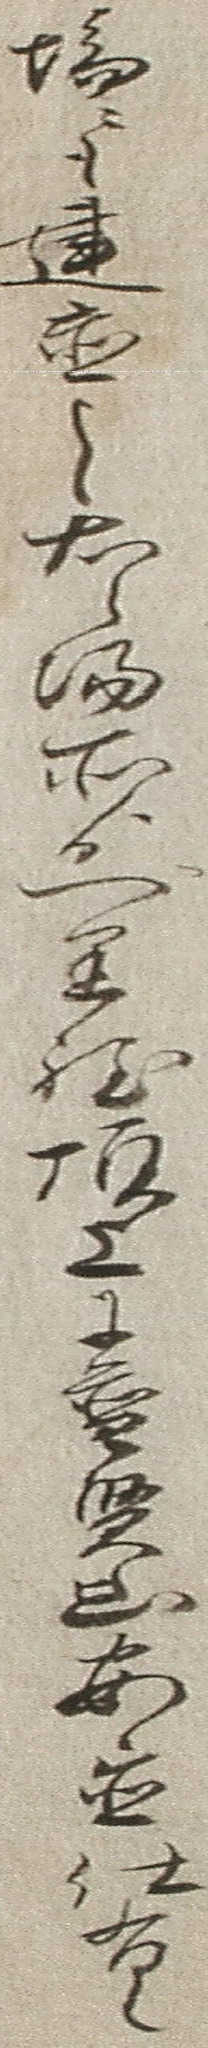場にも建置申候右之場所ゟ一里程頂上に普賢山安置仕有之
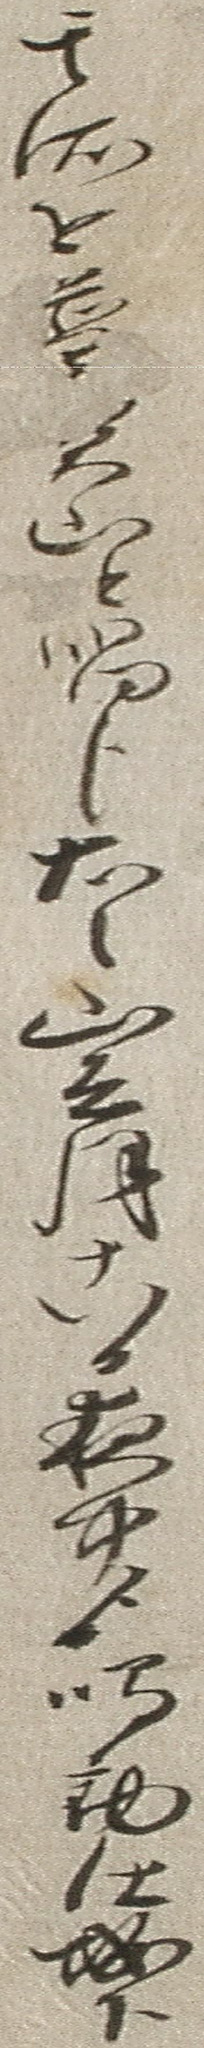其所を普賢山と唱申候右之山去月十八日夜中ゟ鳴動仕城下
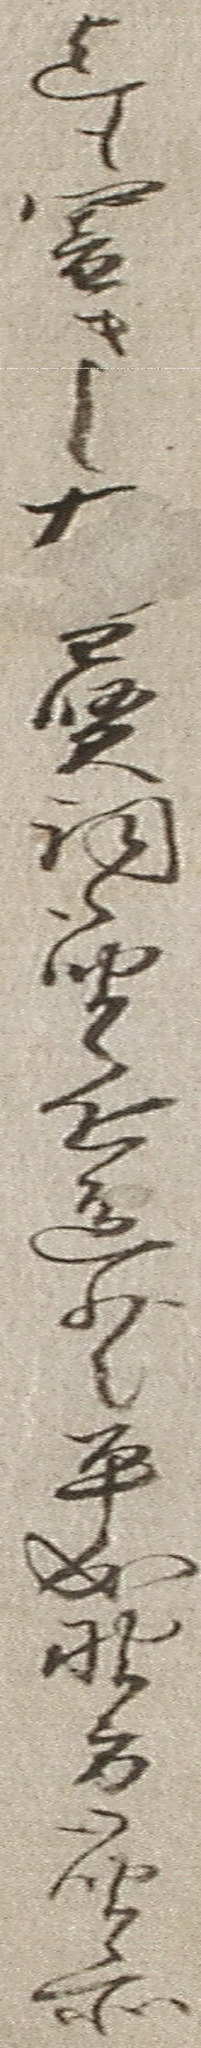迄も響き申候右普賢祠御座候近辺少し平成野方御座候所
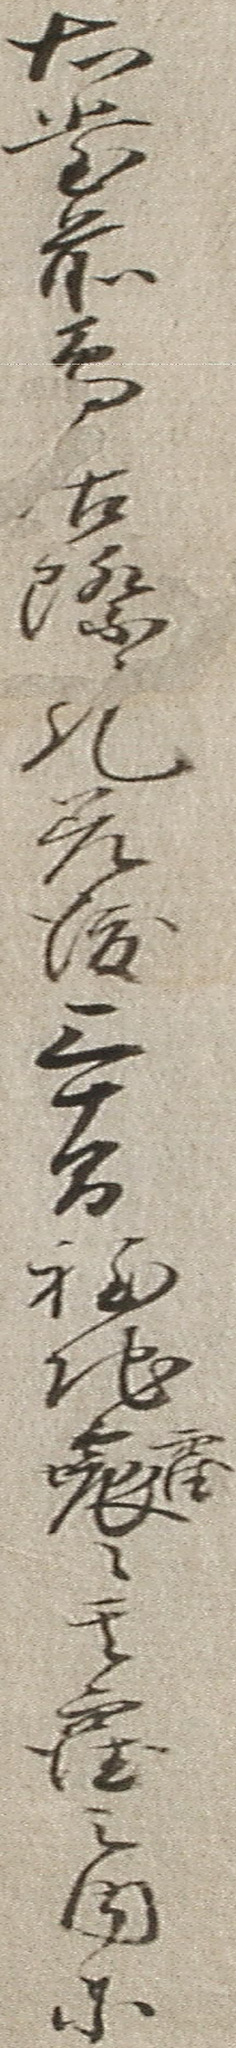右堂前鳥居際に凡差渡三十間程地窪之其窪み内に
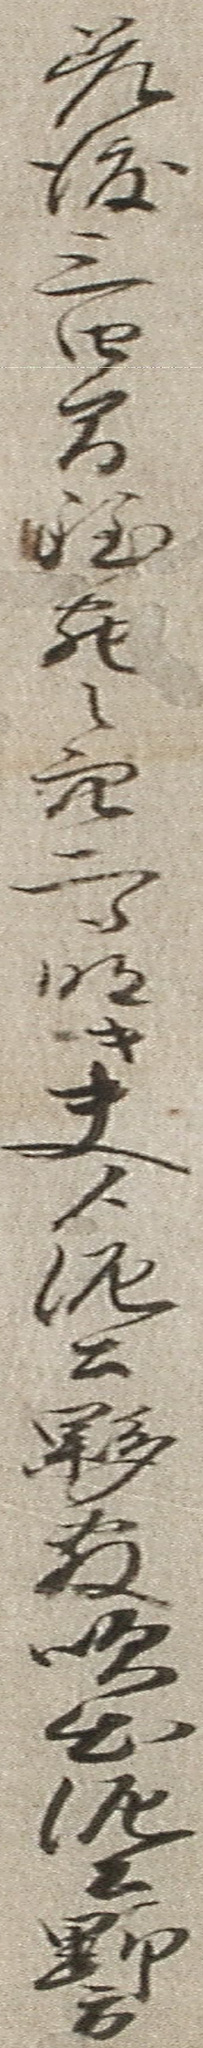差渡三四間程宛之穴二ッ明キ夫ゟ泥土夥敷吹出泥土野方
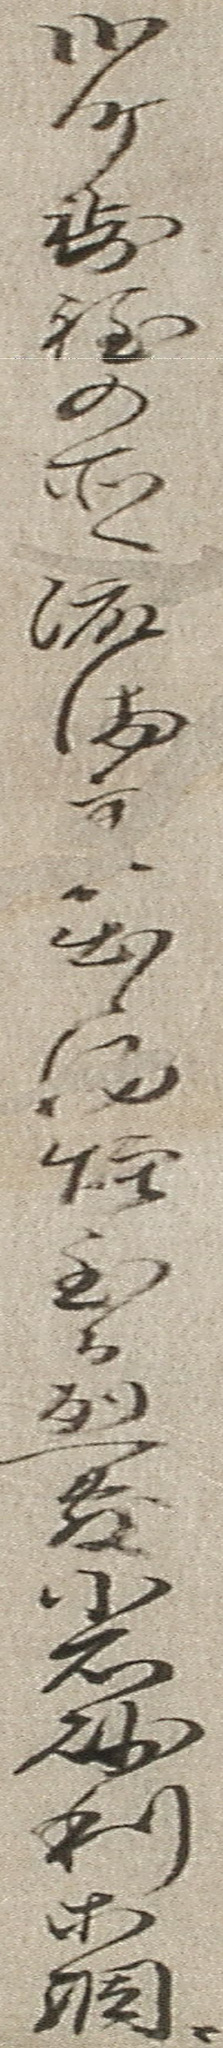弐町歩程の所へ流満方ゟ出候湯煙至而烈敷小石砂利等烟に
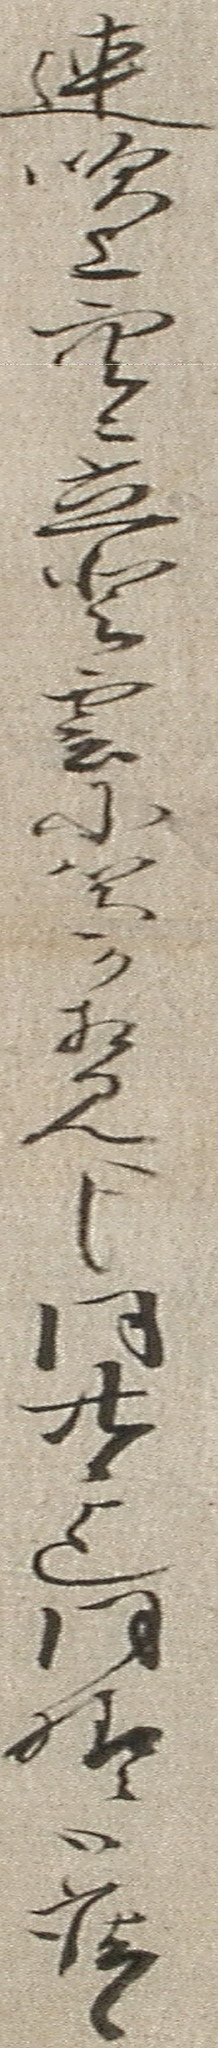連吹上穴に立登雲に等ク相見へ申候同廿日迄同様に御座候
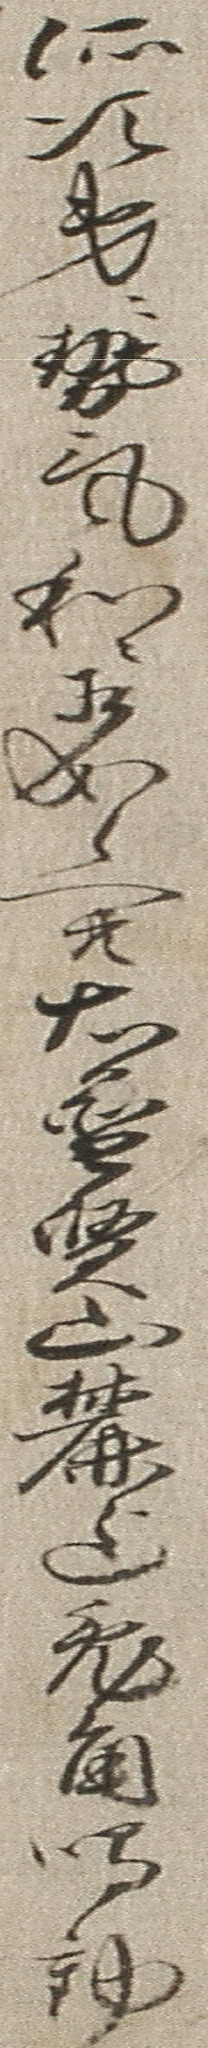所次第に勢気和に相成候へ共右普賢山麓迄兎角鳴動
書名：太平秘録抜書　浅間山燒及普賢山崩
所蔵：東京大学地震研究所図書室 Earthquake Research Institute Library, The University of Tokyo, JAPAN
